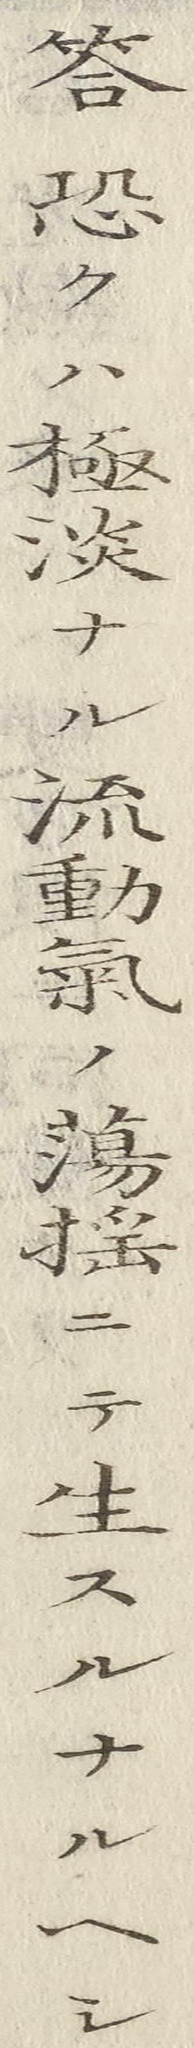答恐クハ極淡ナル流動気ノ蕩揺ニテ生スルナルヘシ
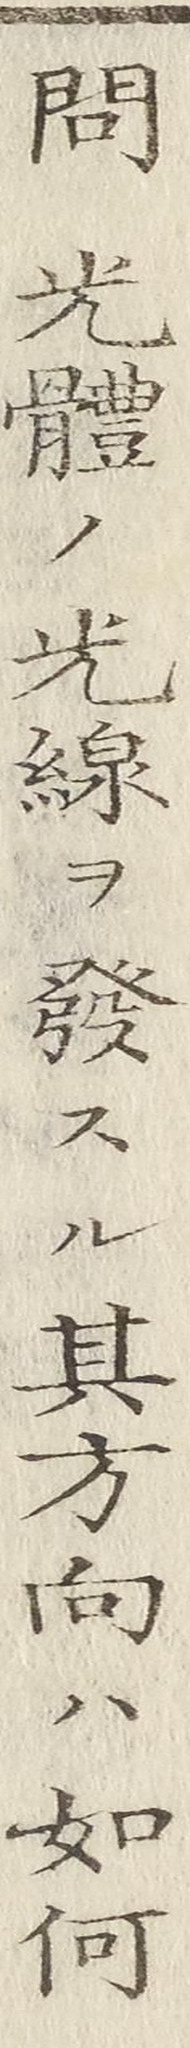問光体ノ光線ヲ発スル其方向ハ如何
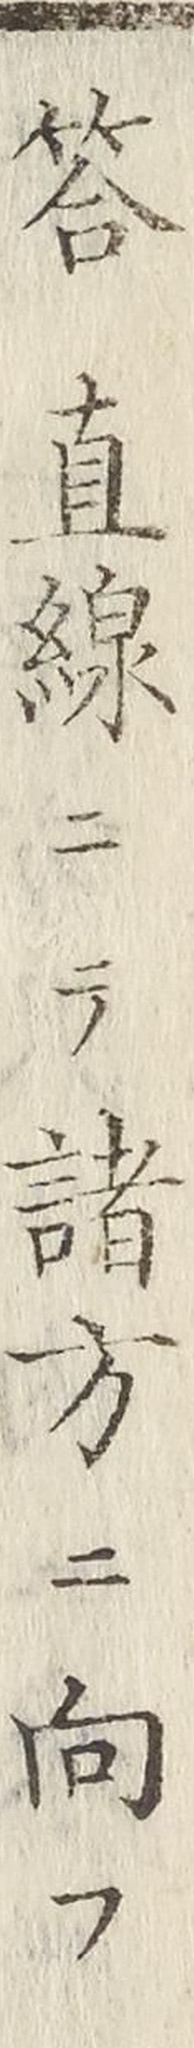答直線ニテ諸方ニ向フ
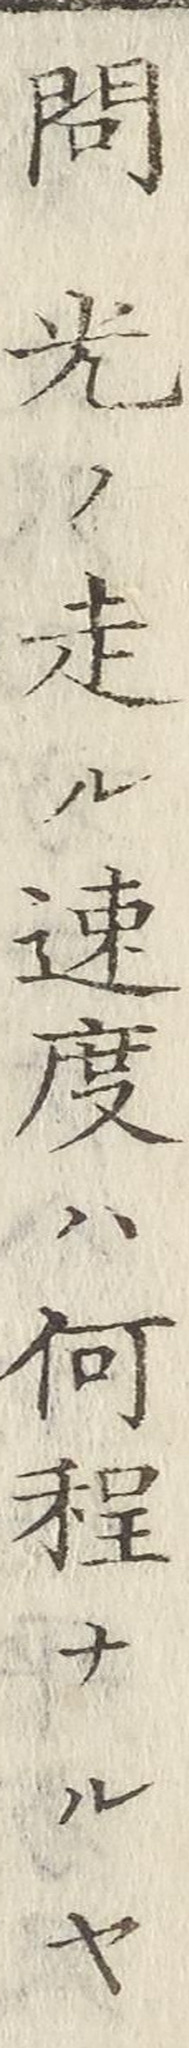問光ノ走ル速度ハ何程ナルヤ
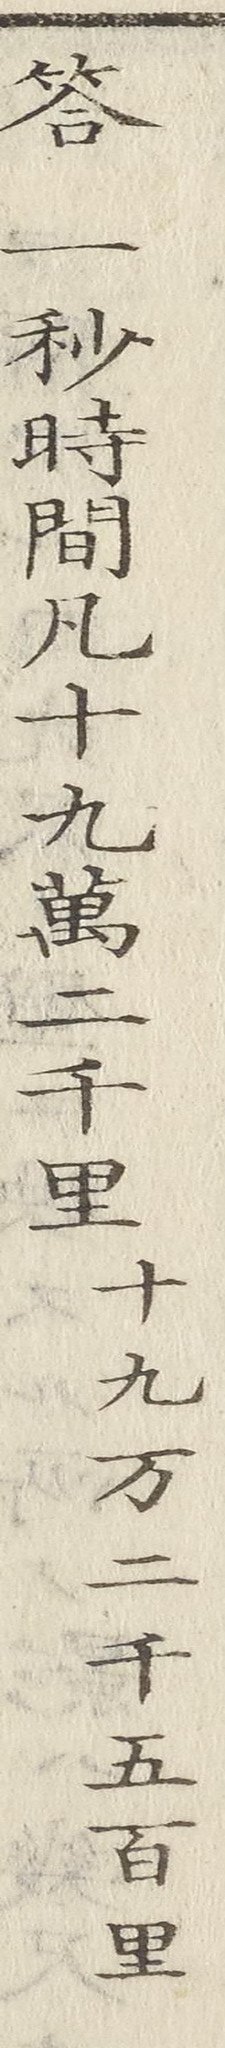答一秒時間凡十九万二千里十九万二千五百里
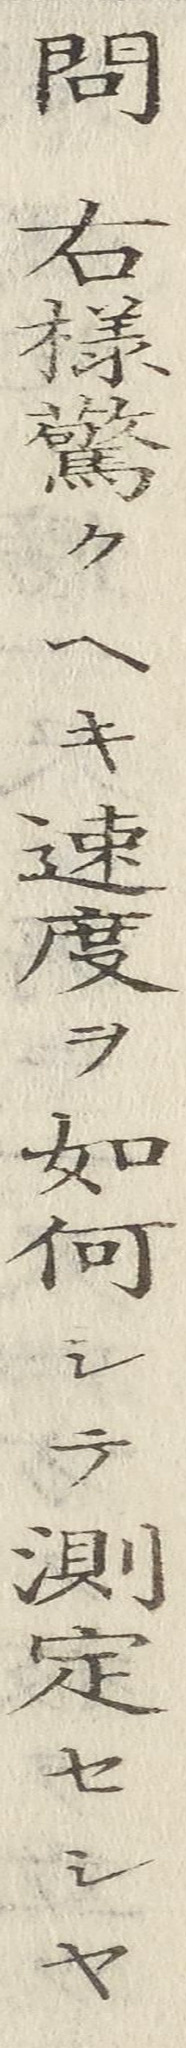問右様驚クヘキ速度ヲ如何レテ測定セシヤ
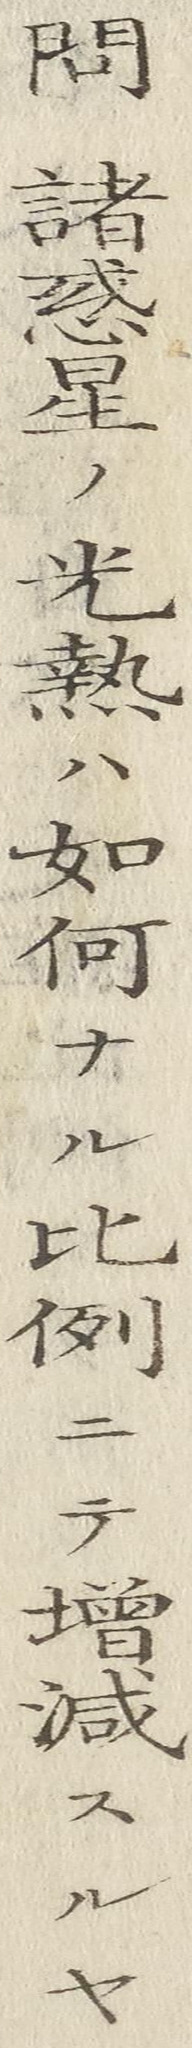問諸惑星ノ光熱ハ如何ナル比例ニテ増減スルヤ

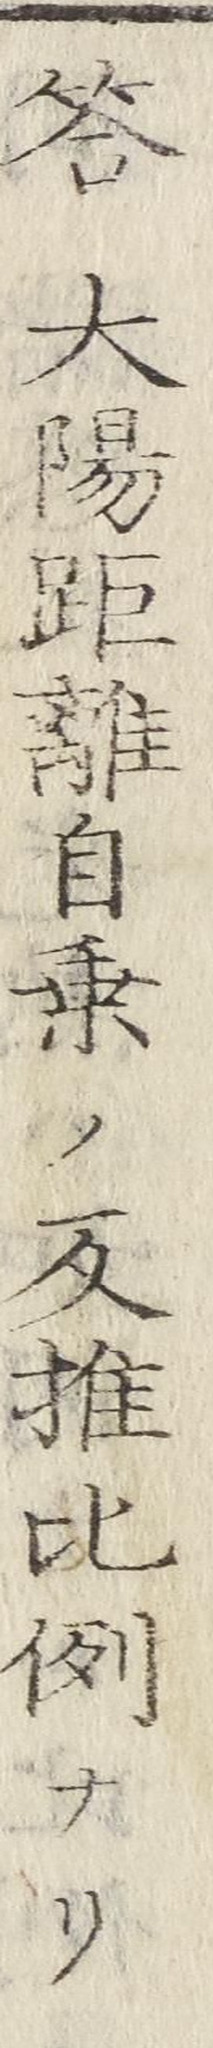答太陽距離自乗ノ反推比例ナリ
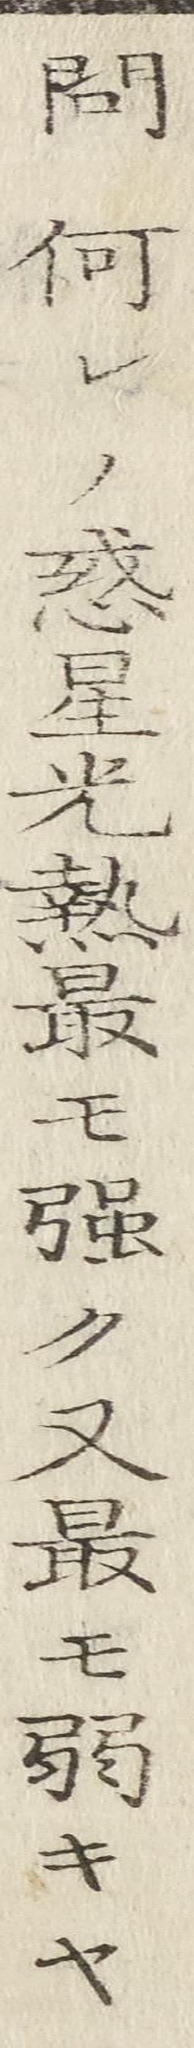問何レノ惑星光熱最モ強ク又最モ弱キヤ
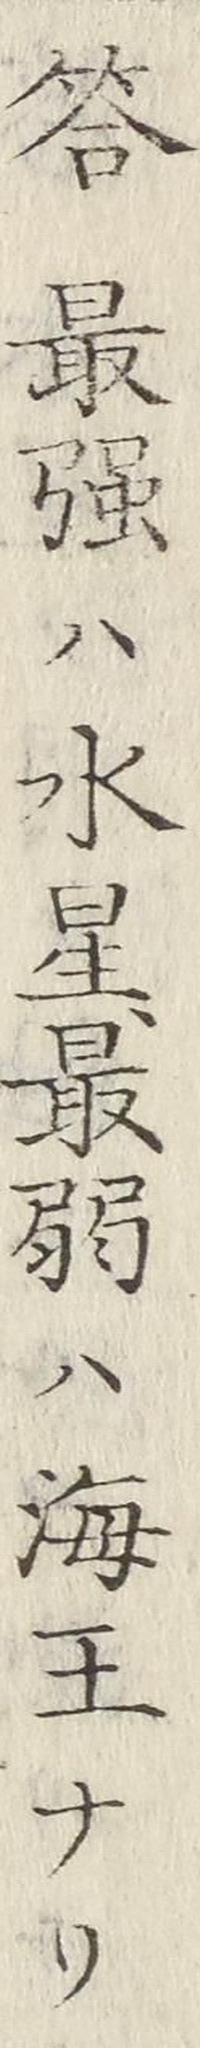答最強ハ水星、最弱ハ海王ナリ
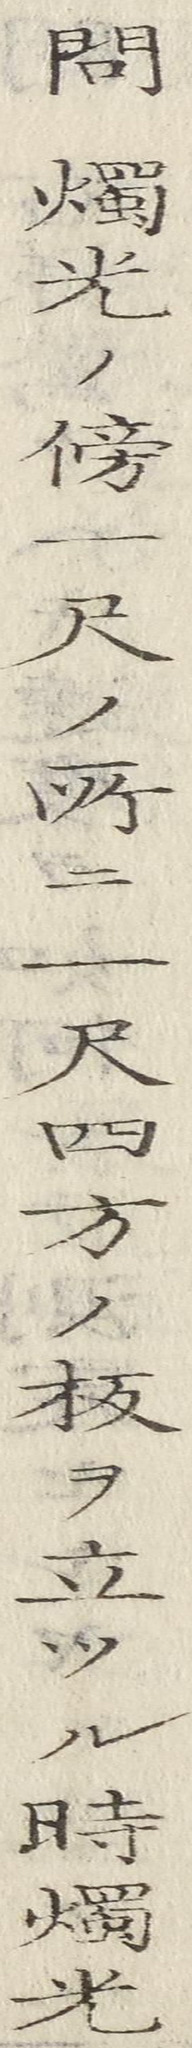問燭光ノ傍一尺ノ所ニ一尺四方ノ板ヲ立ツル時燭光
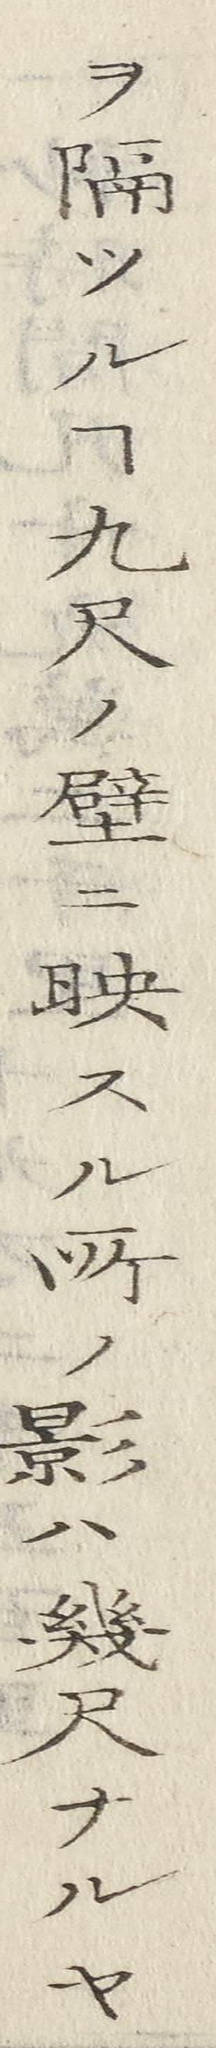ヲ隔ツルコト九尺ノ壁ニ映スル所ノ影ハ幾尺ナルヤ
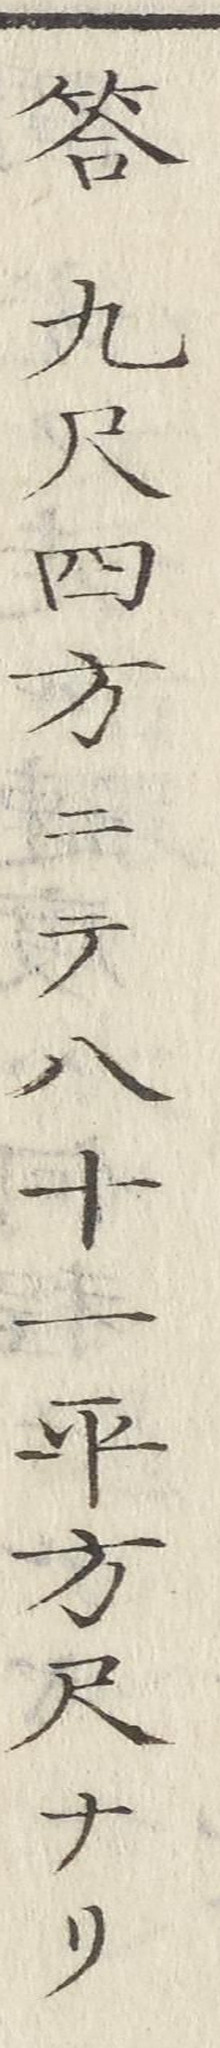答九尺四方ニテ八十一平方尺ナリ
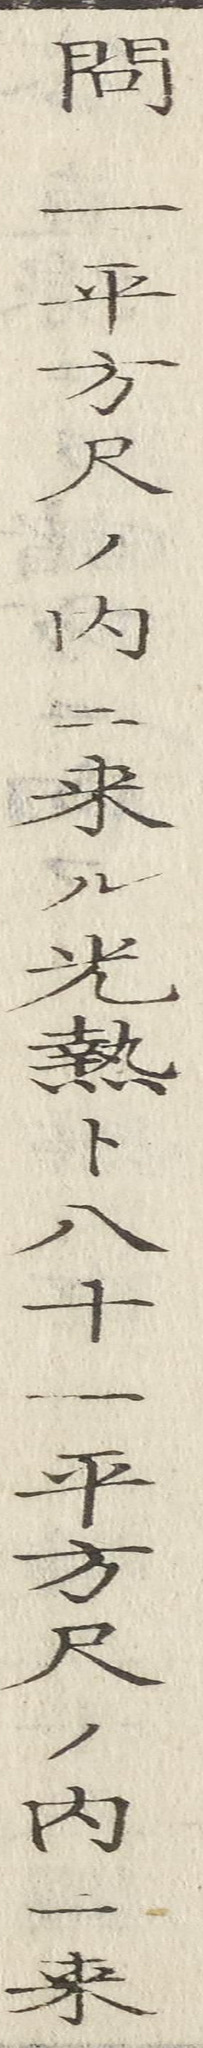問一平方尺ノ内ニ来ル光熱ト八十一平方尺ノ内ニ来
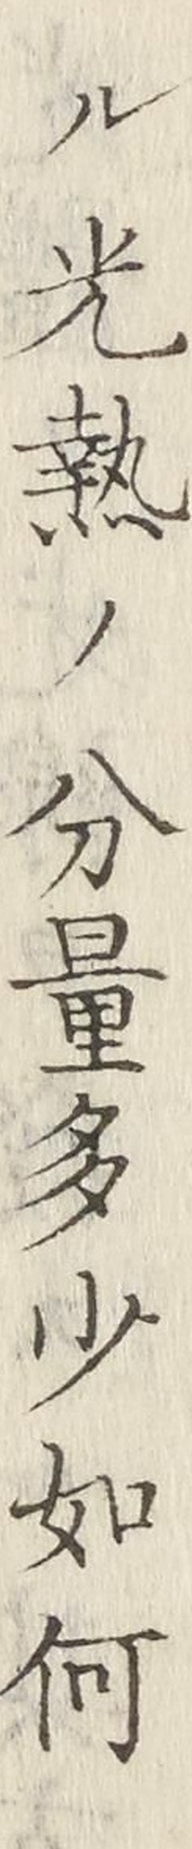ル光熱ノ分量多少如何
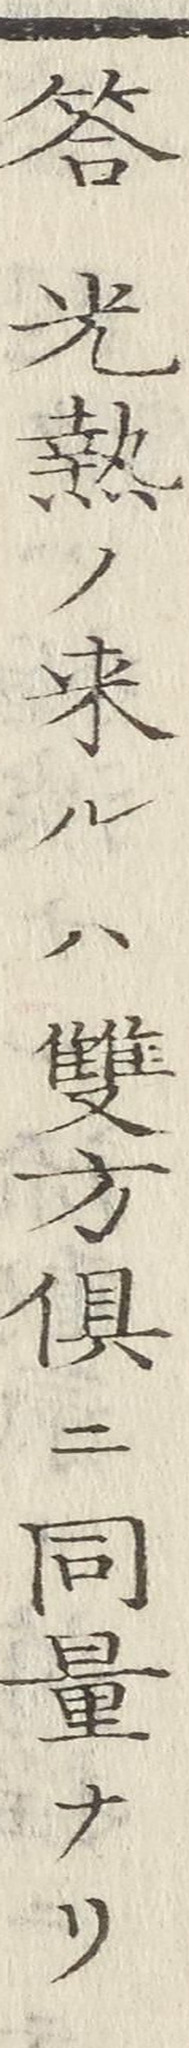答光熱ノ来ルハ双方倶ニ同量ナリ
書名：星学圖説　下
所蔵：東京大学地震研究所図書室 Earthquake Research Institute Library, The University of Tokyo, JAPAN
